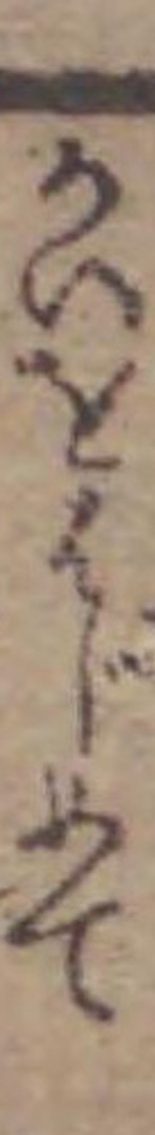かいをはじめて
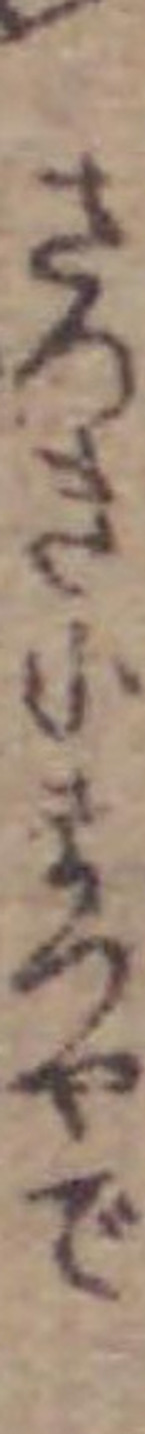さつき小まつやで
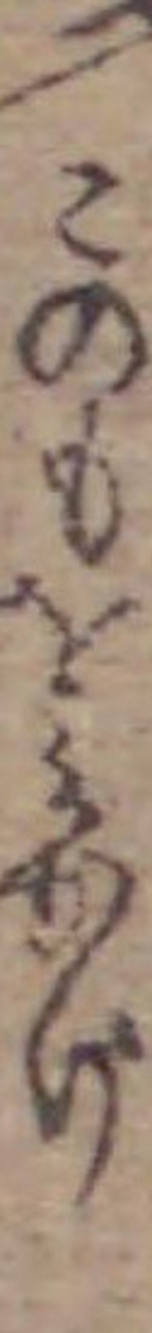このもをみかけ
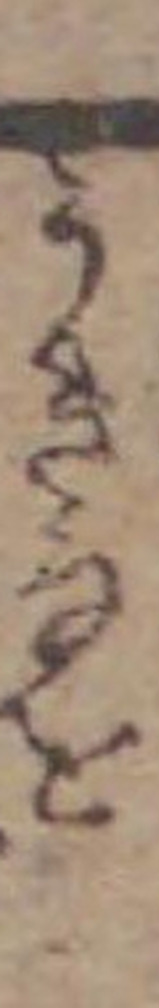うきなを
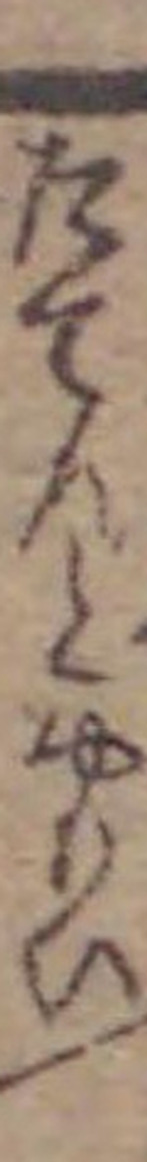たてんとおもひ
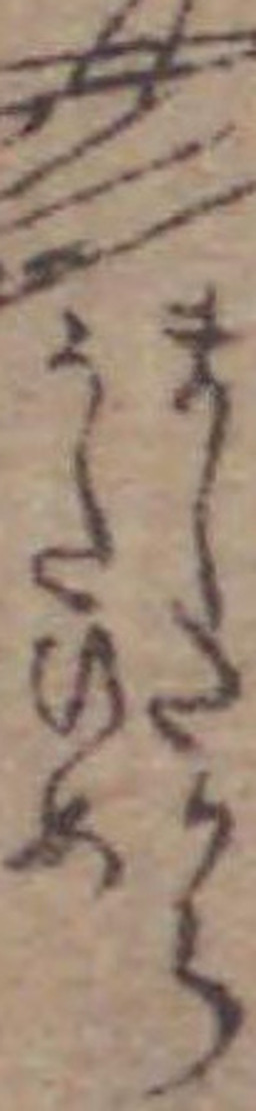うたひめ
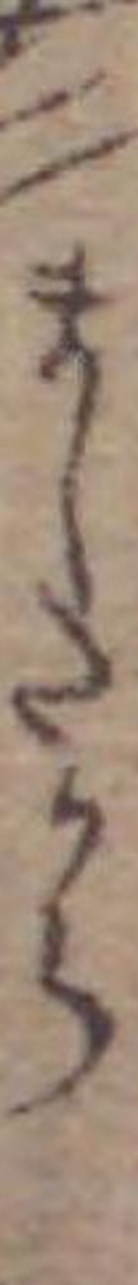ましたから
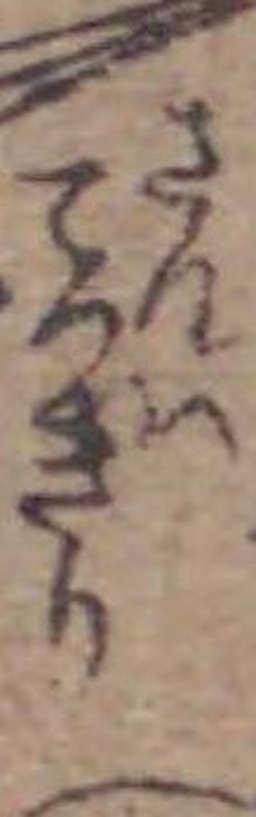てつきり
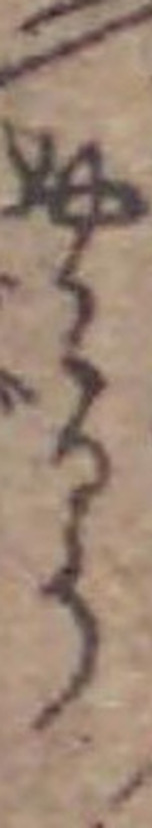おわるう
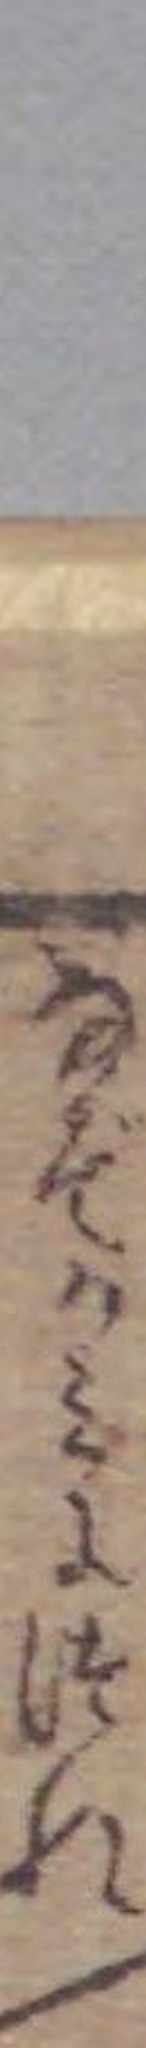なぞかみにつれ
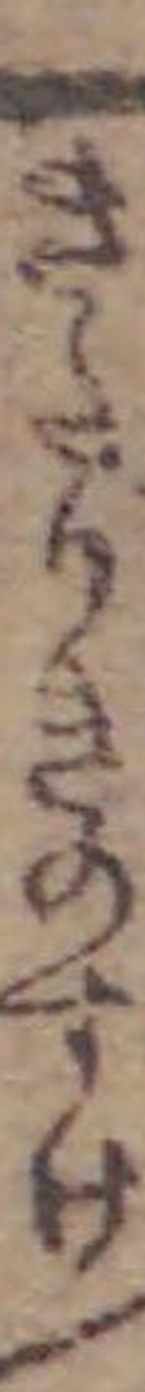きたりきのすけ
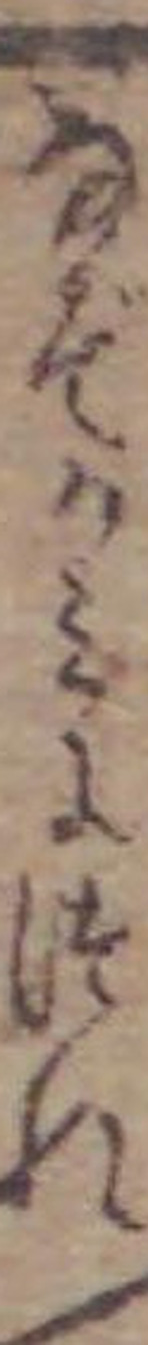なぞかみにつれ
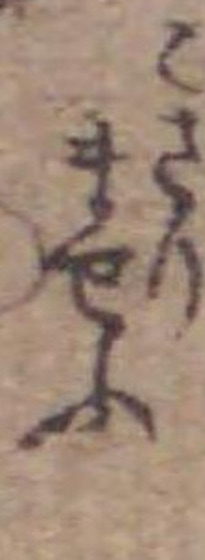ませう
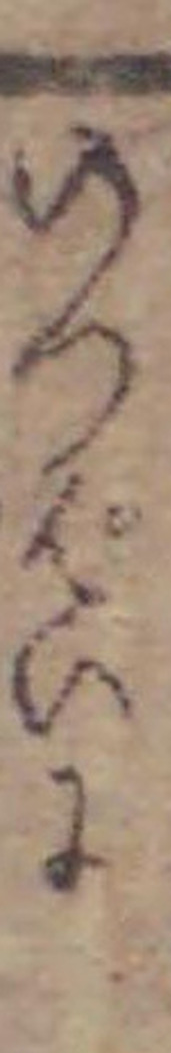いつぱいに
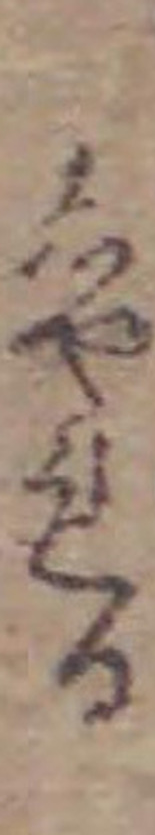しやれる

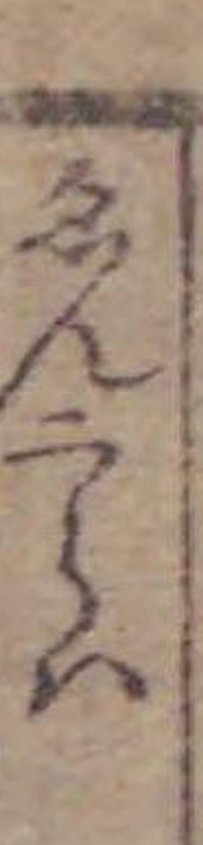ゑん二郎は
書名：江戸生艶気樺焼 : 3巻
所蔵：国立国会図書館 National Diet Library, JAPAN
